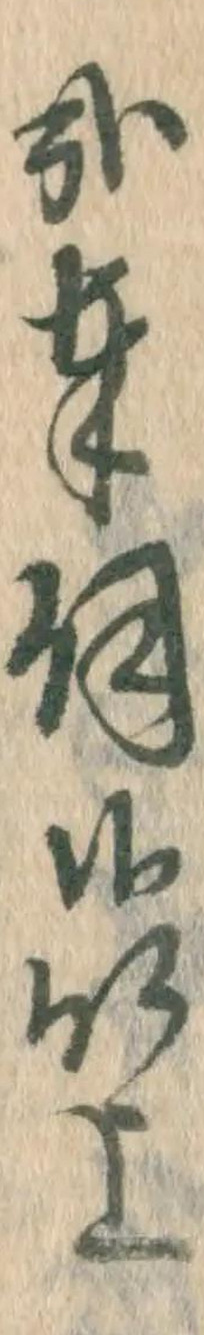哉奉伺候以上
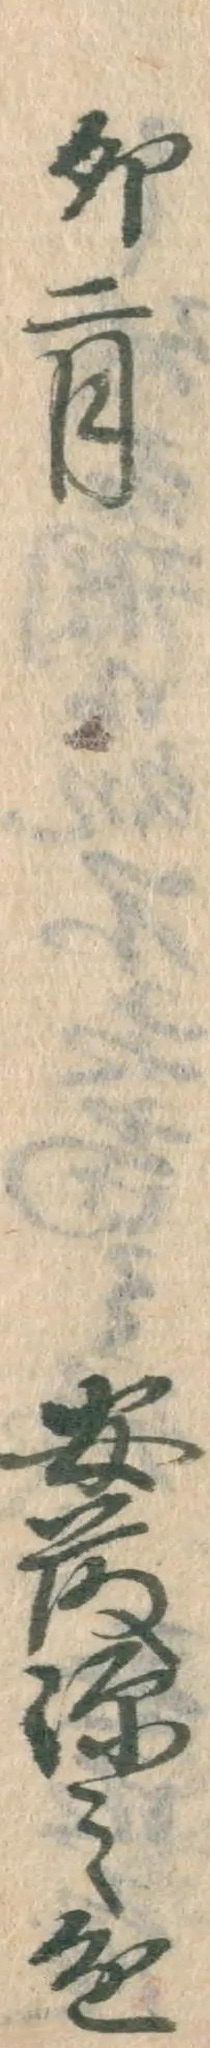卯二月安藤源之進
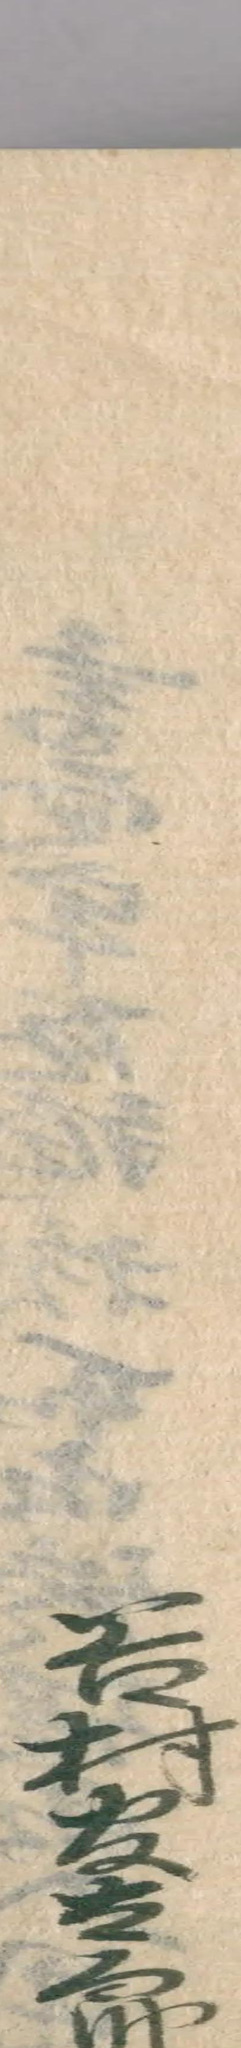谷村官太郎
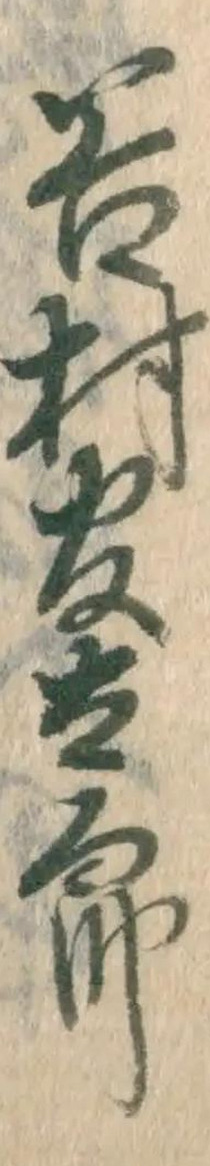谷村官太郎

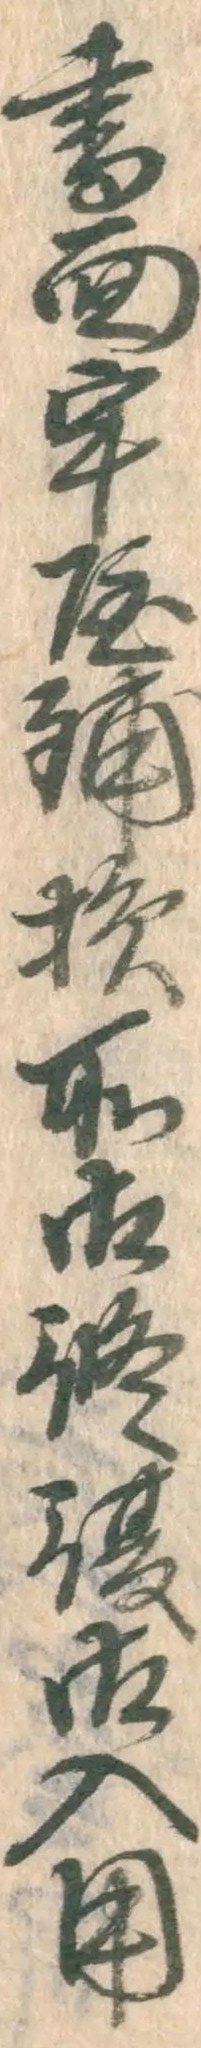書面牢屋鋪損所御修復御入用
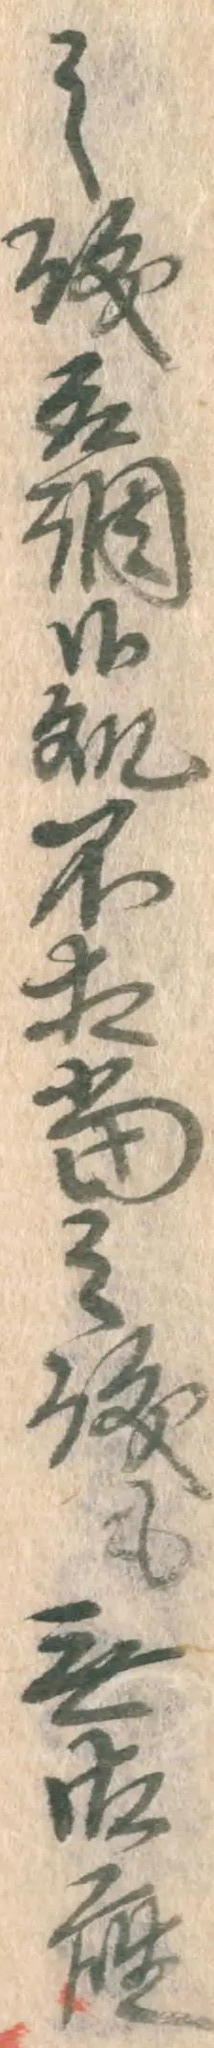之儀取調候処不相当之儀も無御座
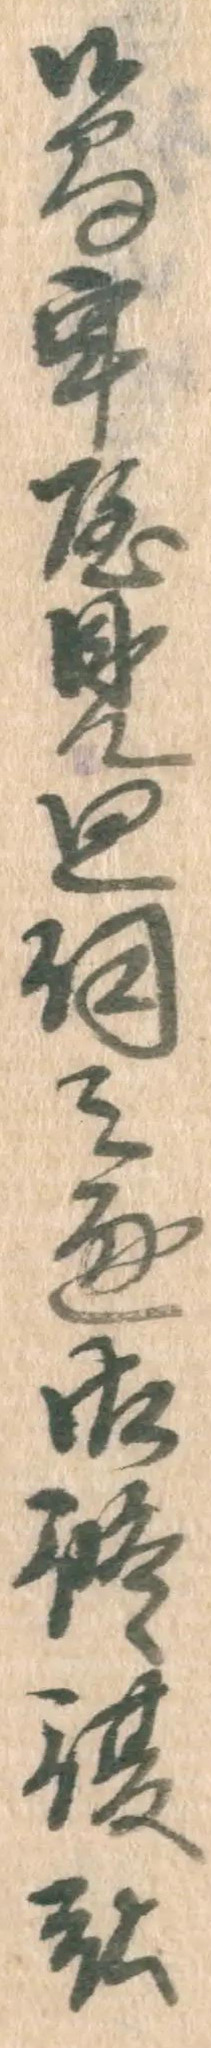候間牢屋見廻伺之通御修復被
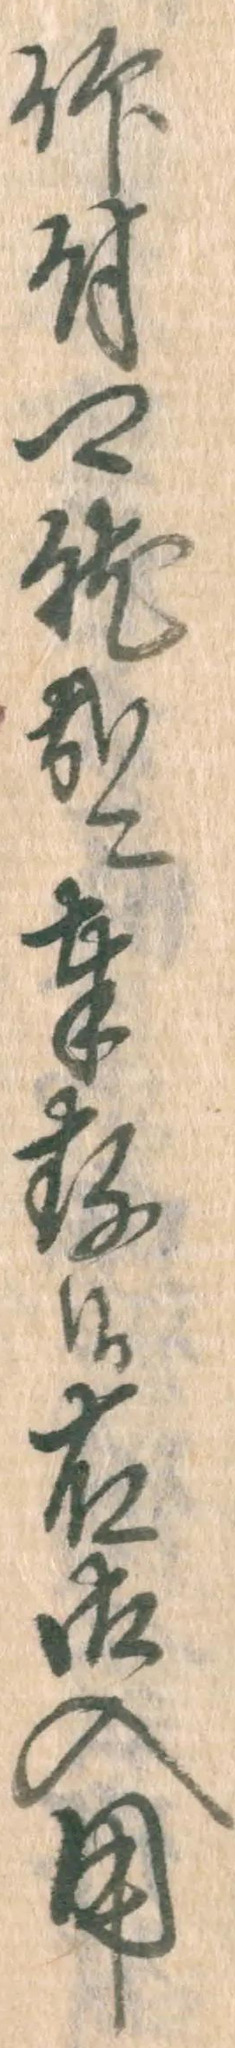仰付可然哉ニ奉存候右御入用
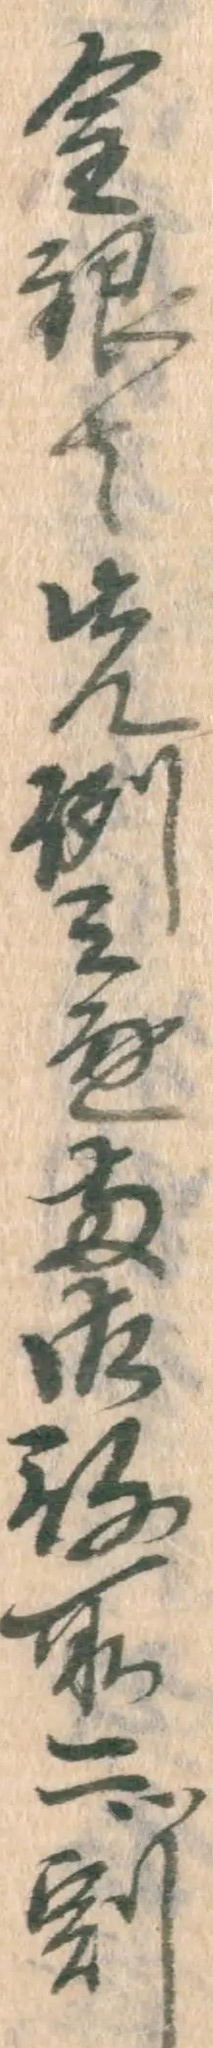金銀は先例之通両御役所二ツ割
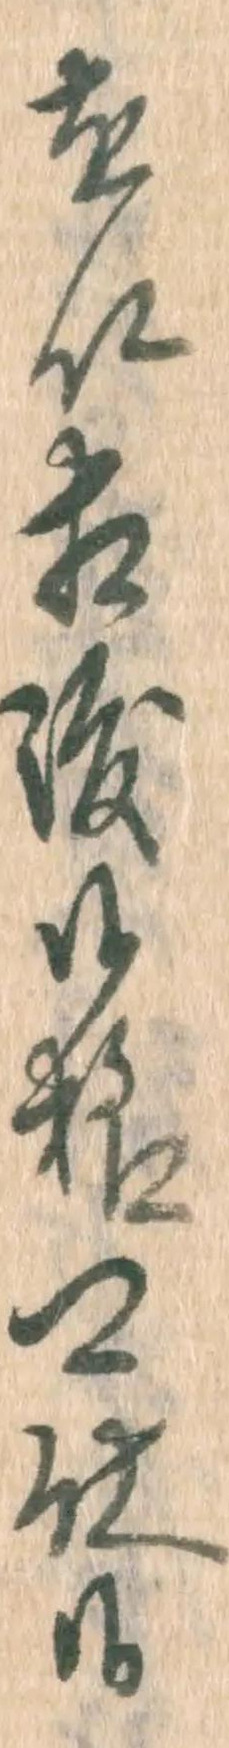を以相渡候様可仕候
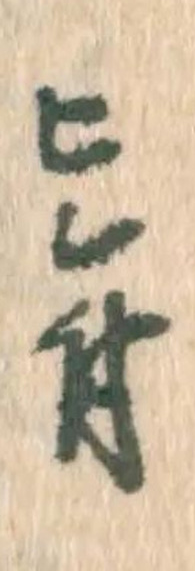ヒレ付
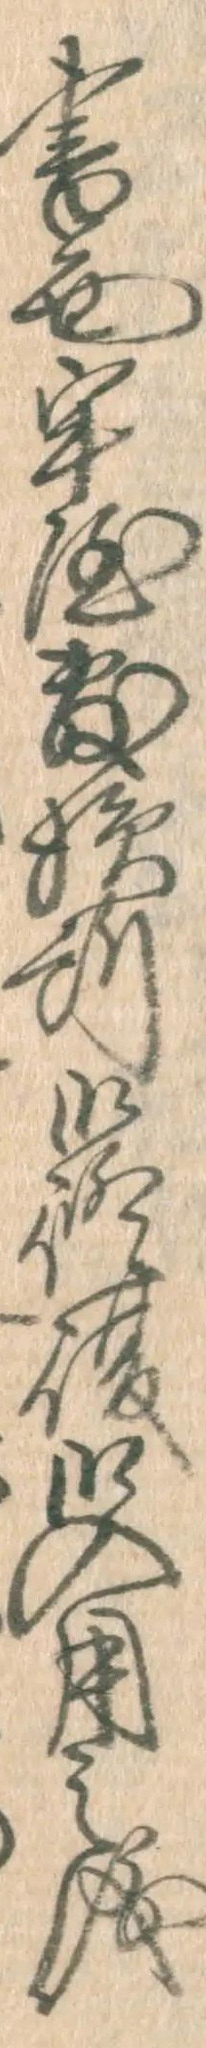書面牢屋敷損所御修復御入用之儀
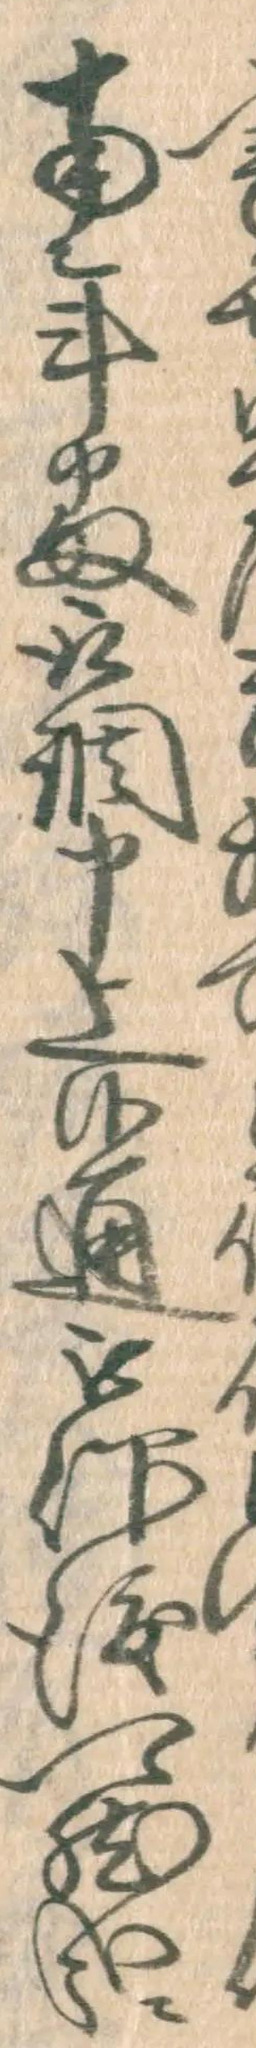南年番取調申上候通被仰渡可然哉ニ
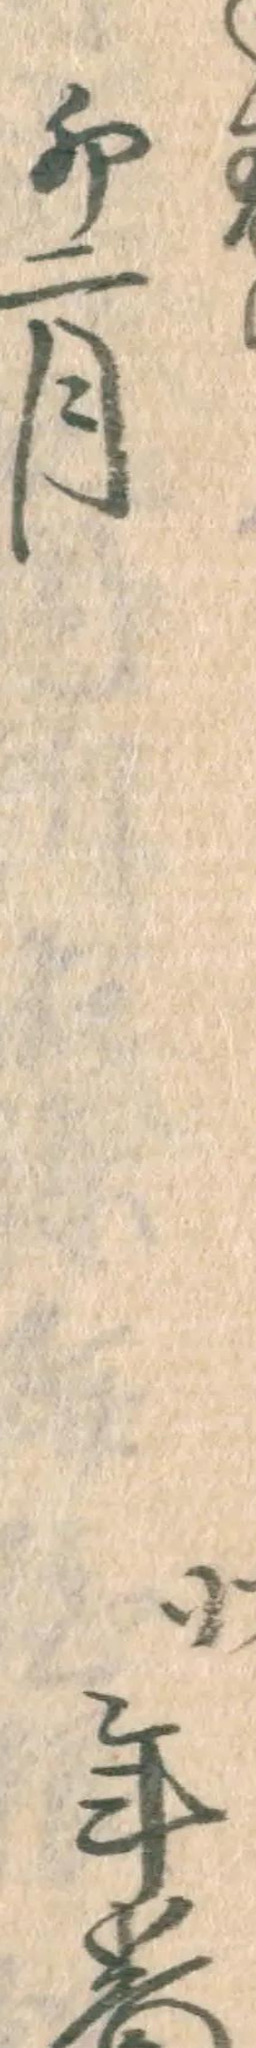卯二月年番

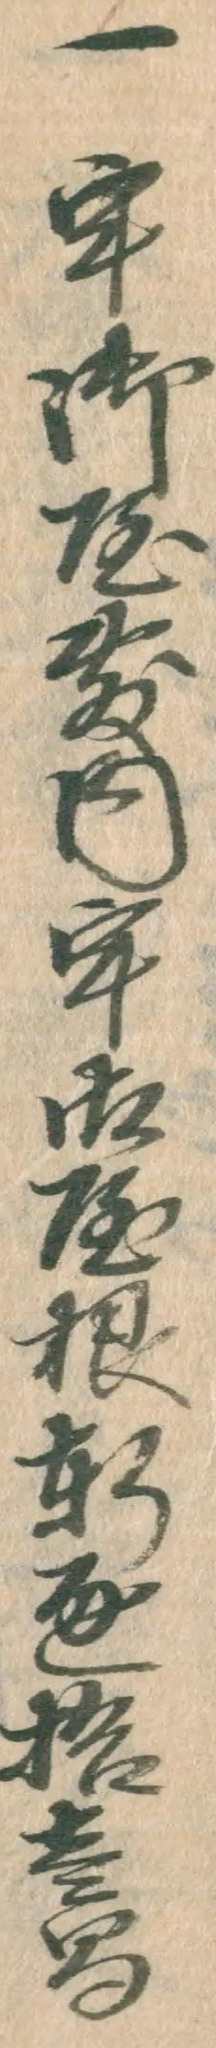一牢御屋敷内牢御屋根軒通拾壱間
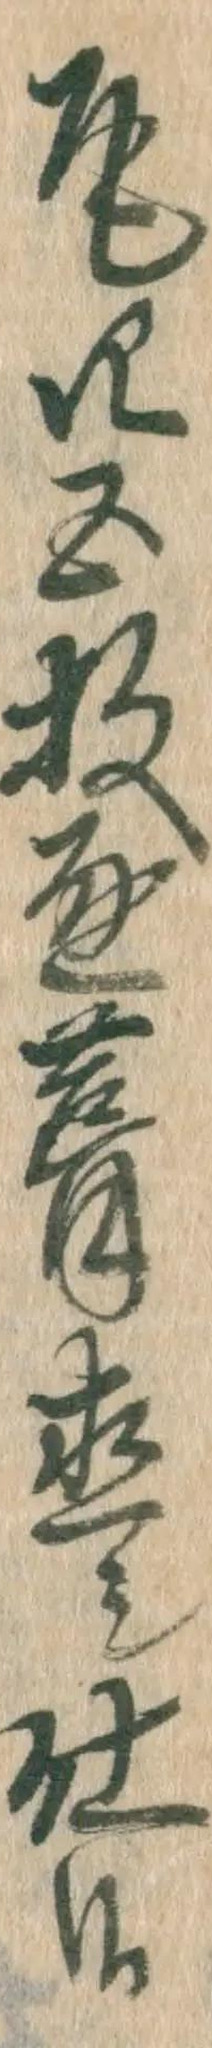瓦四五枚通葺直シ仕候
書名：七十冊物類集 71巻. [44] 四十三 牢屋敷御普請御修覆地震ニ付骨折候牢屋掛御褒美之部
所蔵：国立国会図書館 National Diet Library, JAPAN
